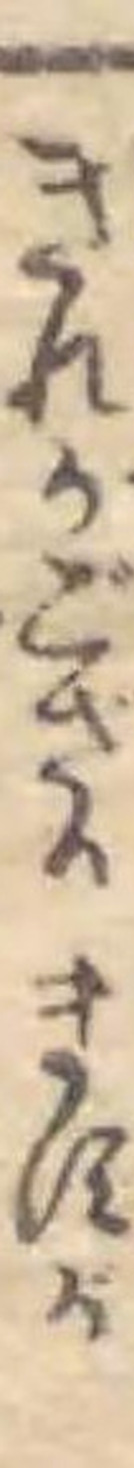きれがござりますが
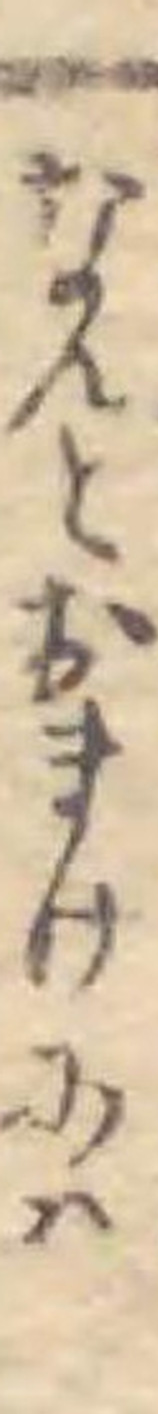なんとおまけには
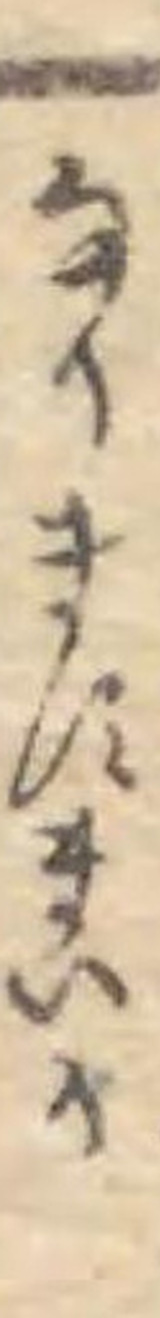なりますまいか
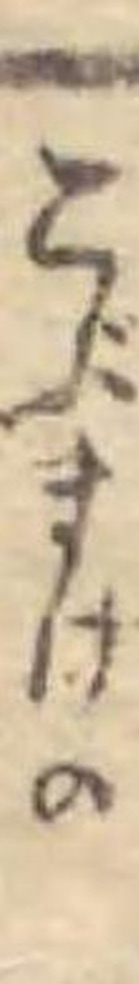こぶすけの
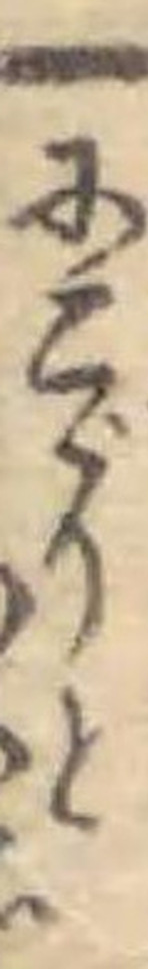にこゞりと
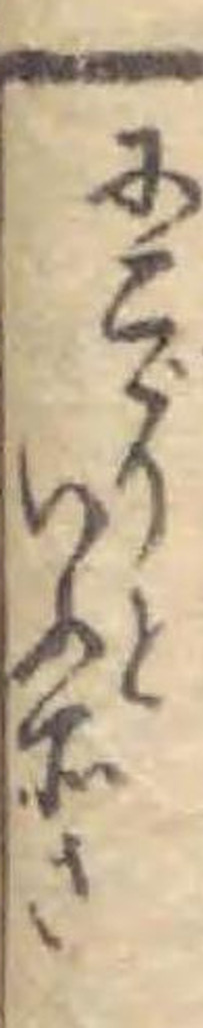にこゞりと
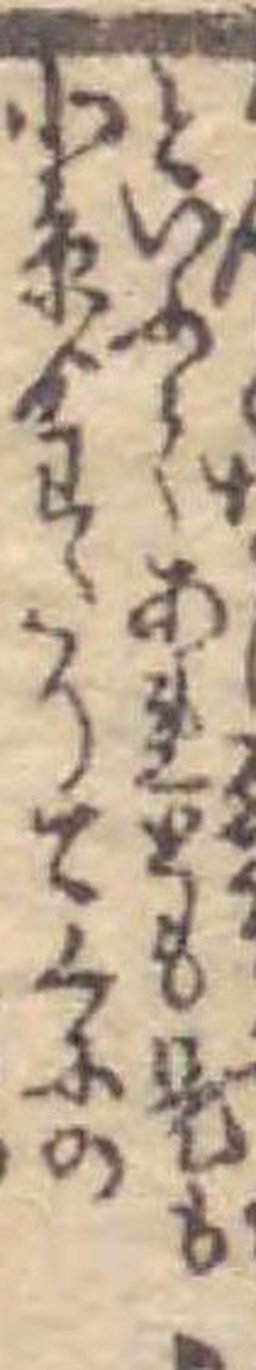北京よりわたりてくにの
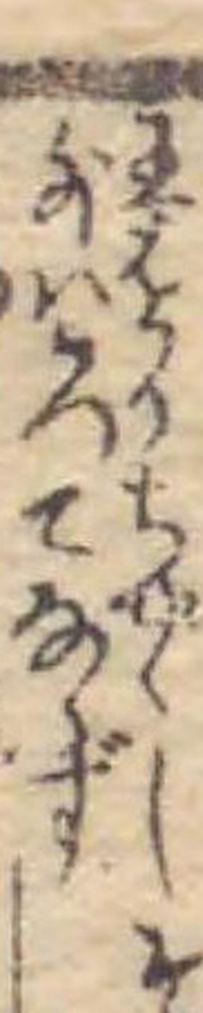外はかつてならず
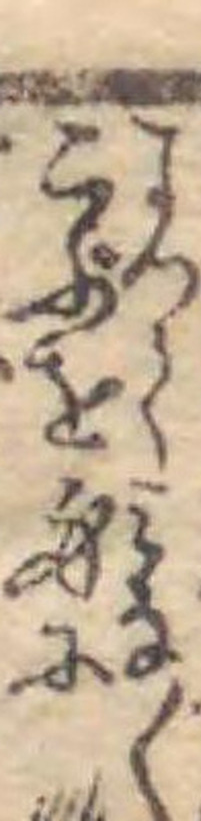こぶを身に
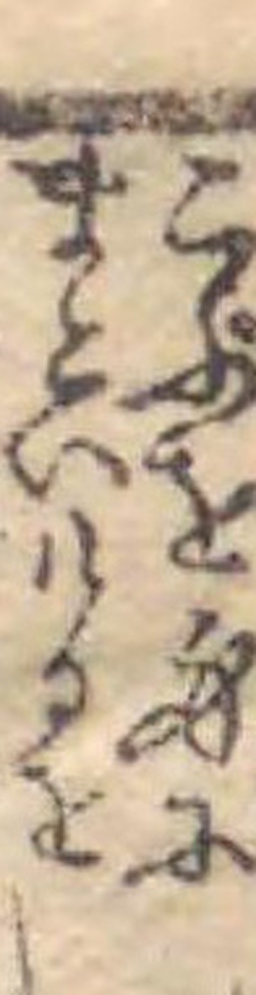まといけるを
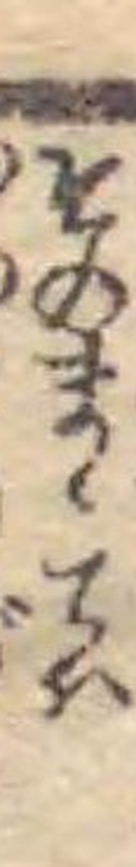そのまゝては
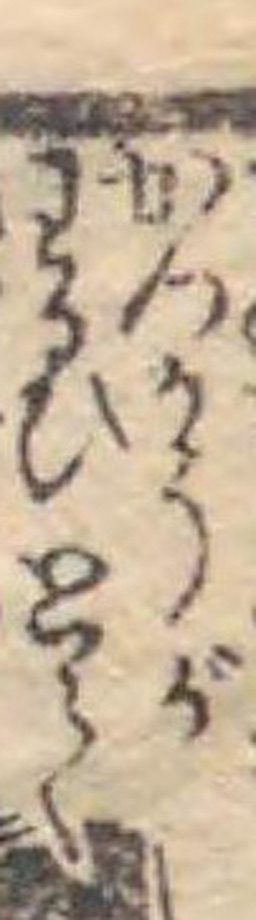わるひとて
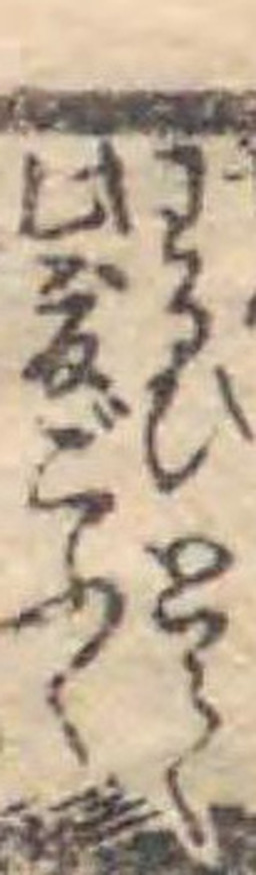此度ごふく
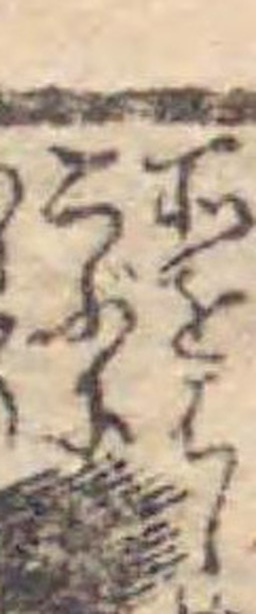こぶに
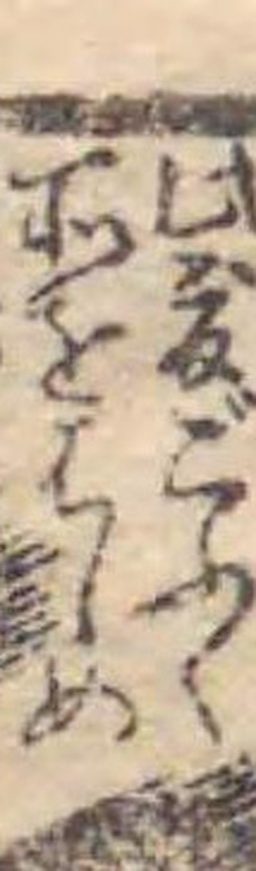所をはしめ
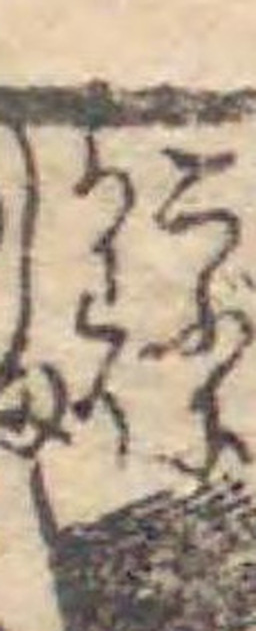かわり
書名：悦贔負蝦夷押領 : 3巻
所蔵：国立国会図書館 National Diet Library, JAPAN
